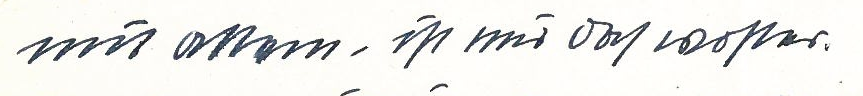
mit allem, ist mir doch wohler.
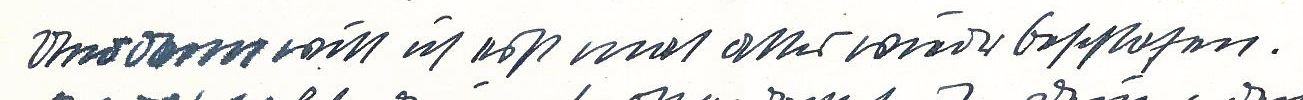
Und dann will ich erst mal alles wieder beschlafen.
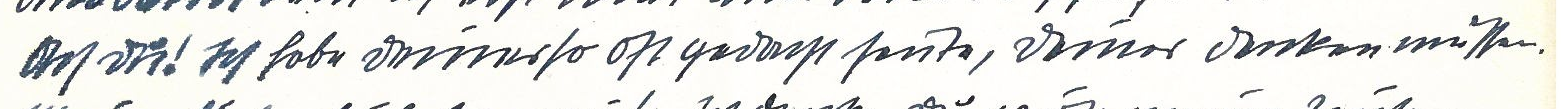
Ach Du! Ich habe Deiner so oft gedacht heute, Deiner denken müssen.
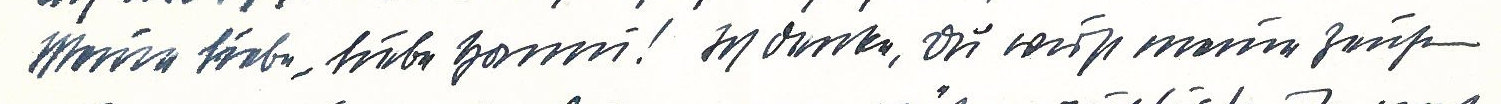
Meine liebe, liebe ! Ich denke, Du wirst meine Zeilen
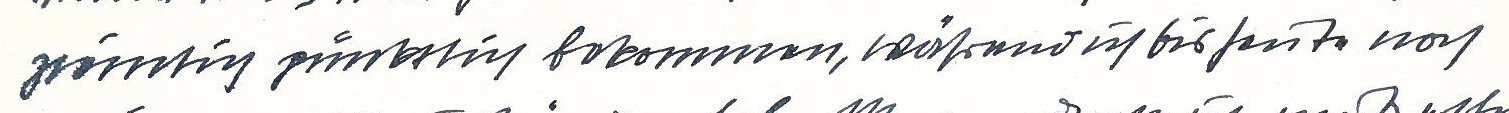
ziemlich pünktlich bekommen, während ich bis heute noch
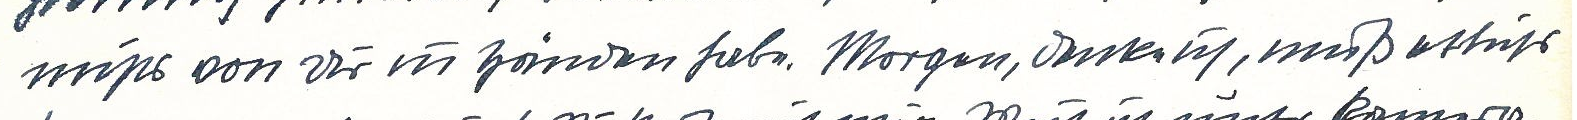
nichts von Dir in Händen habe. Morgen, denke ich, muß etlichs
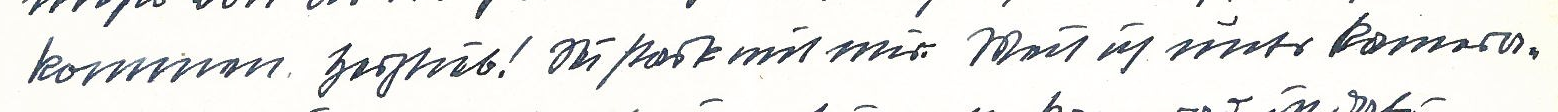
kommen. Herzlieb! Sei stark mit mir. Weil ich untr Kamera¬
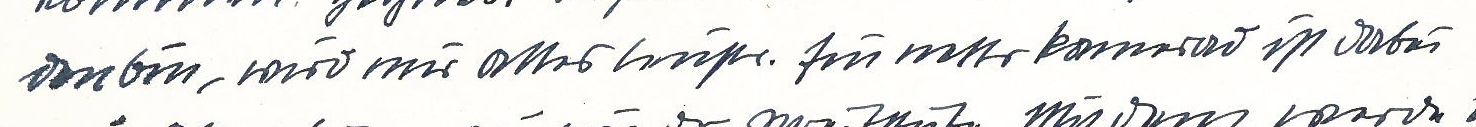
den bin, wird mir alles leichtr. Ein nettr Kamerad ist dabei
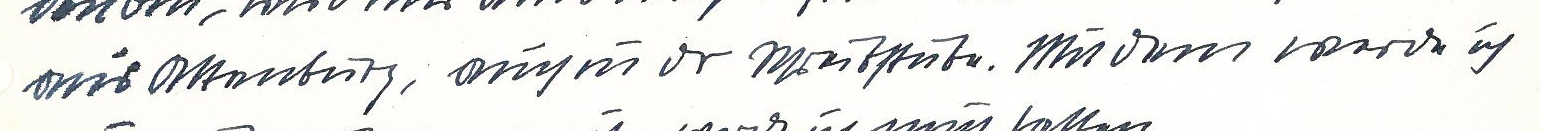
aus A., auch in dr Schreibstube. Mit dem werde ich
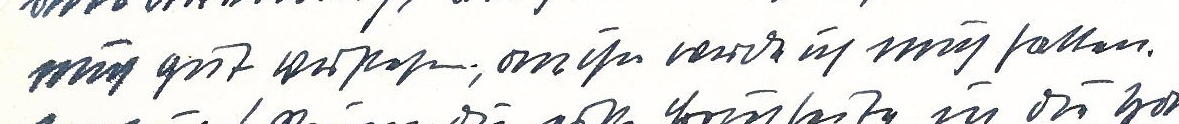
mich gut verstehen; an ihn werde ich mich halten.
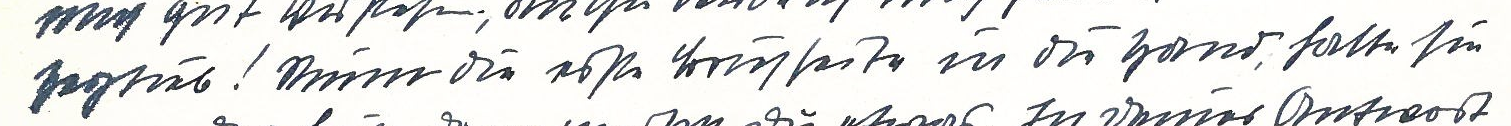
Herzlieb! Nimm die erste Briefseite in die Hand, halte sie
